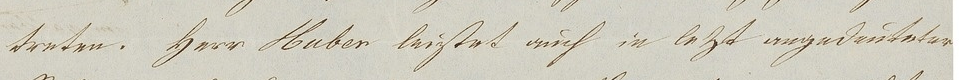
treten. Herr Huber leistet auch in letzt angedeuteter
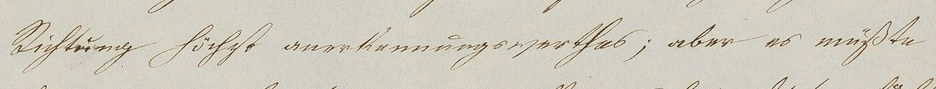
Richtung höchst anerkennungswerthes; aber es müßte
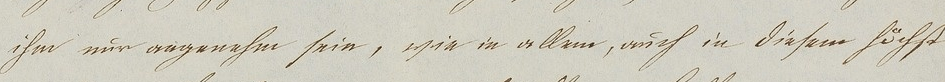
ihm nur angenehm sein, wie in allem, auch in diesem höchst
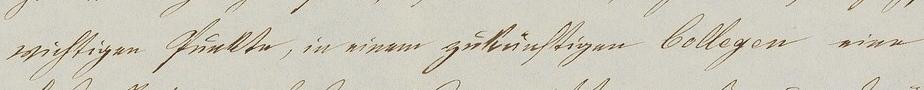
wichtigen Punkte, in einem zukünftigen Collegen eine
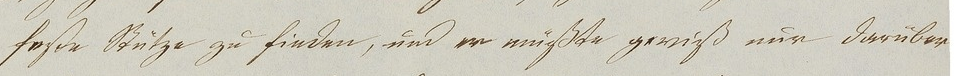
feste Stütze zu finden, und er müßte gewiß nur darüber
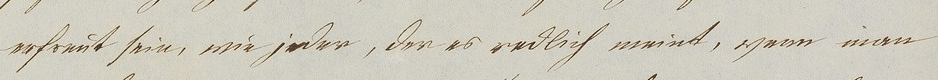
erfreut sein, wie jeder, der es redlich meint, wenn man
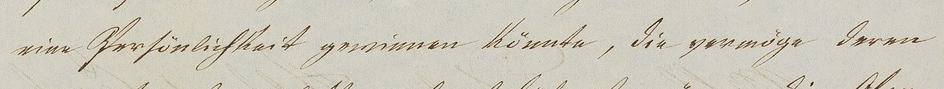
eine Persönlichkeit gewinnen könnte, die vermöge deren
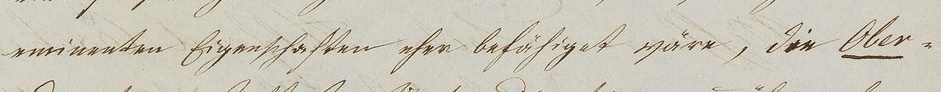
eminenten Eigenschaften eher befähiget wäre, die Ober-
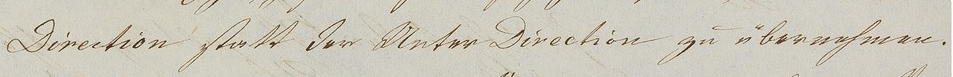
Direction statt der Unter-Direction zu übernehmen.
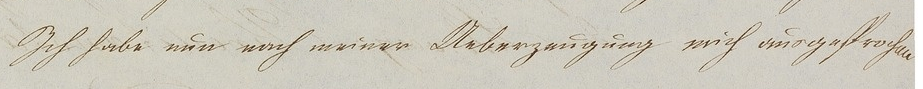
Ich habe nun nach meiner Ueberzeugung mich ausgesprochen
